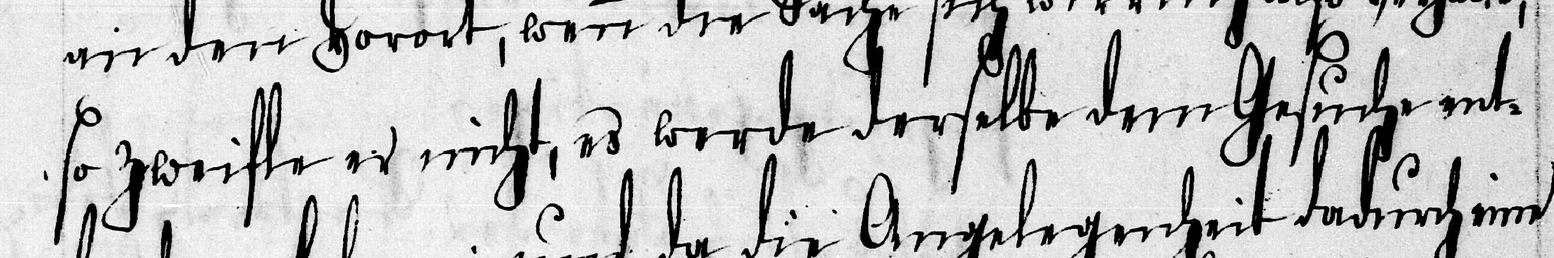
so zweifle er nicht, es werde derselbe dem Gesuche ent¬
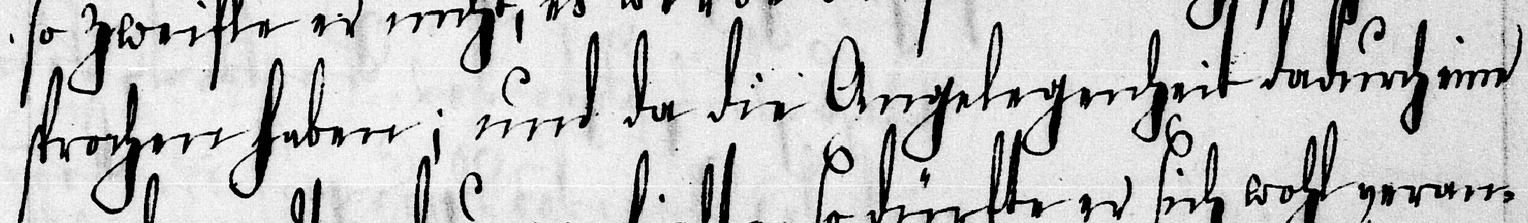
sprochen haben; und da die Angelegenheit dadurch eine
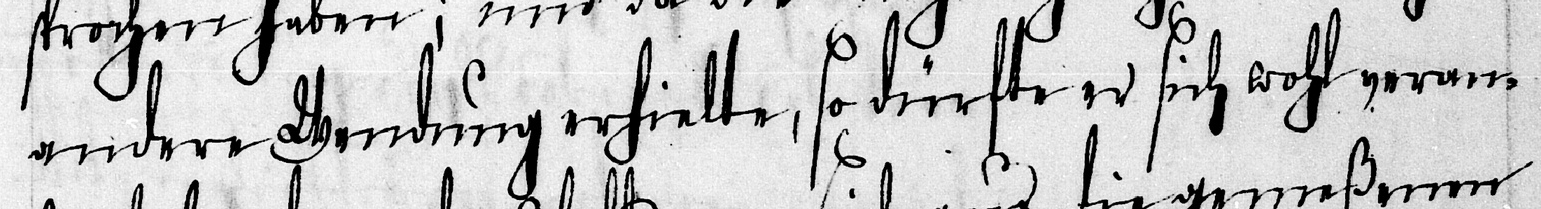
andere Wendung erhielte, so dürfte er sich wohl veran¬
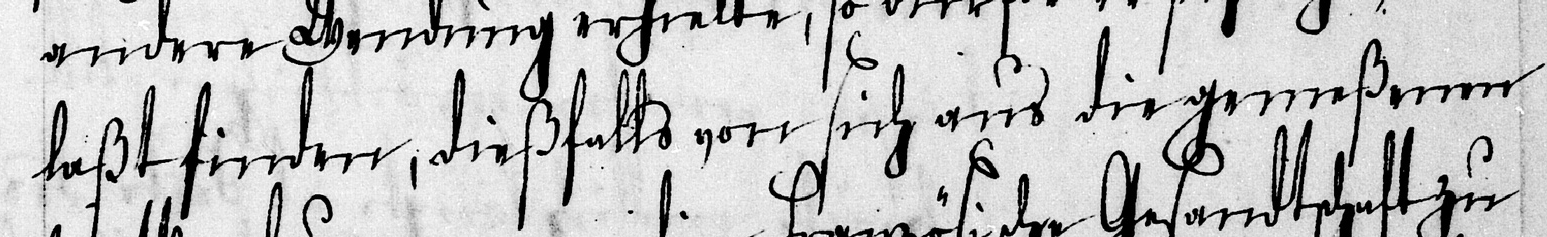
laßt finden, dießfalls von sich aus die gemeßenen
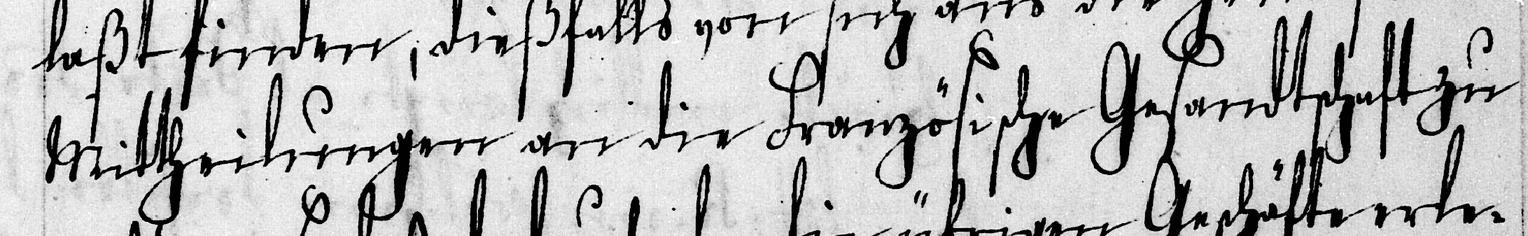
Mittheilungen an die Französische Gesandtschaft zu
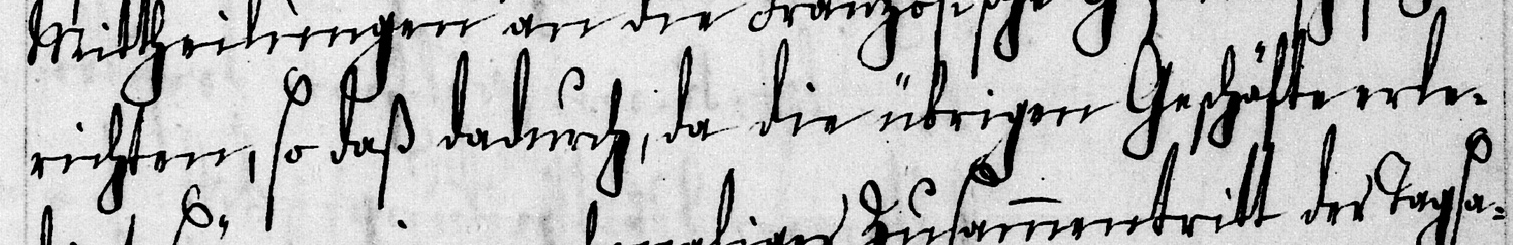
richten, so daß dadurch, da die übrigen Geschäfte erle¬
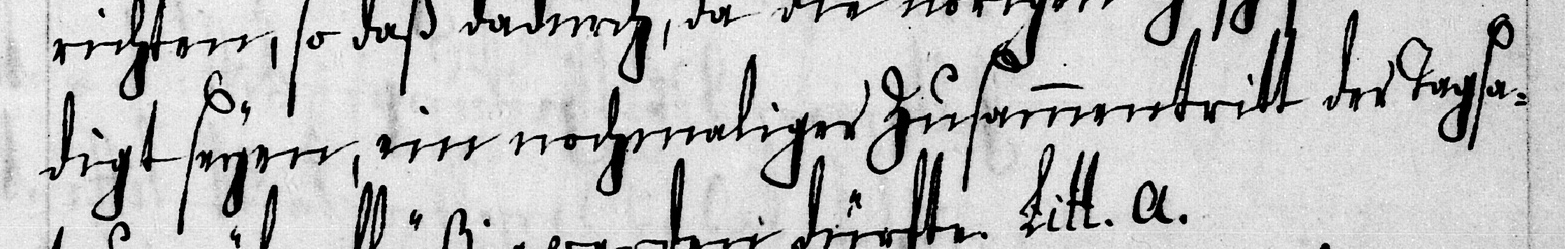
digt seyen, ein nochmaliger Zusammentritt der Tagsa¬
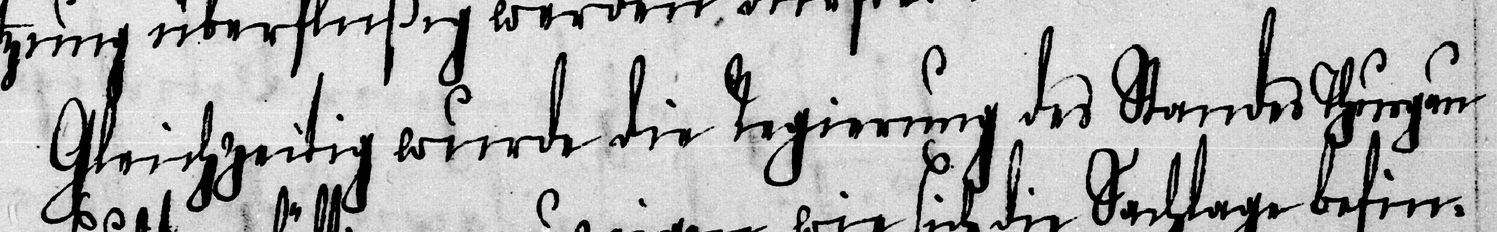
Gleichzeitig wurde die Regierung des Standes Thurgau
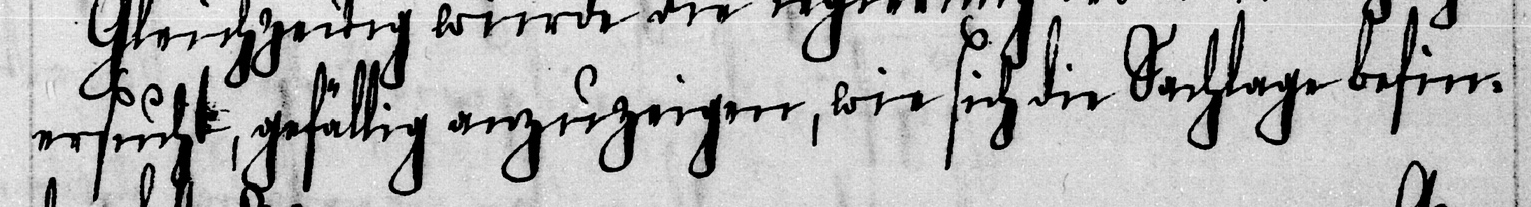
ersucht, gefällig anzuzeigen, wie sich die Sachlage befin¬
